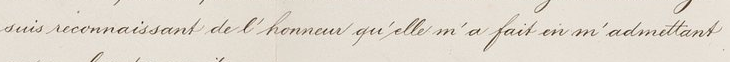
suis reconnaissant de l'honneur qu'elle m'a fait en m'admettant
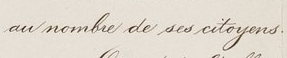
au nombre de ses citoyens.
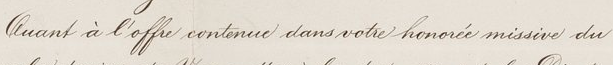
Quant à l'offre contenue dans votre honorée missive du
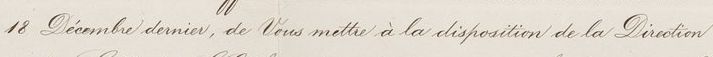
18 Décembre dernier, de Vous mettre à la disposition de la Direction
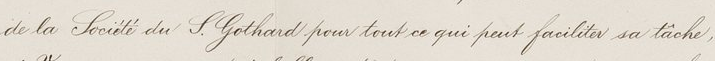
de la Société du S. Gothard pour tout ce qui peut faciliter sa tâche,
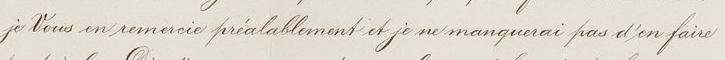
je Vous en remercie préalablement et je ne manquerai pas d'en faire
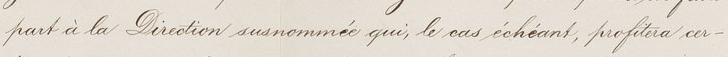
part à la Direction susnommée qui, le cas échéant, profitera cer-
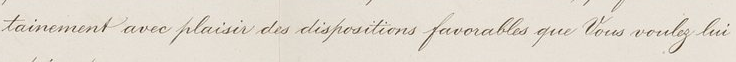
tainement avec plaisir des dispositions favorables que Vous voulez lui
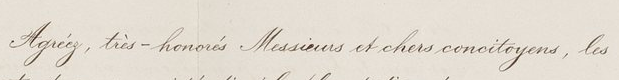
Agréez, très-honorés Messieurs et chers concitoyens, les
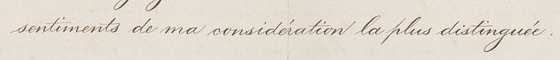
sentiments de ma considération la plus distinguée.
